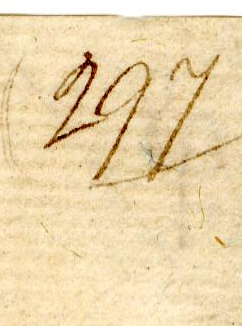297
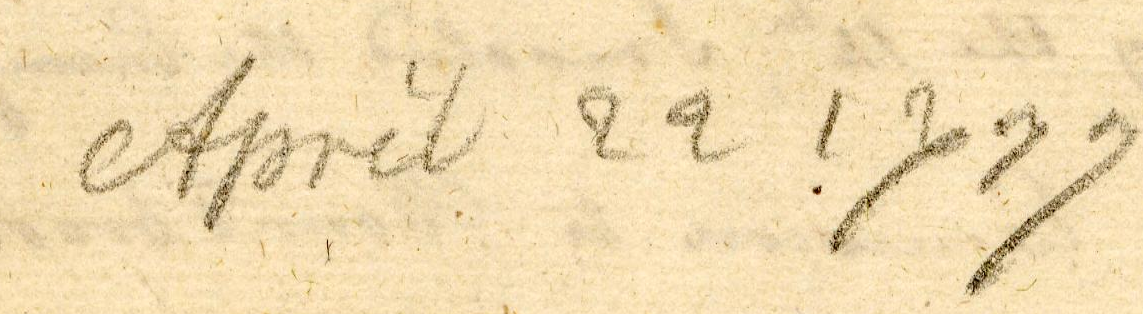April 22 1777
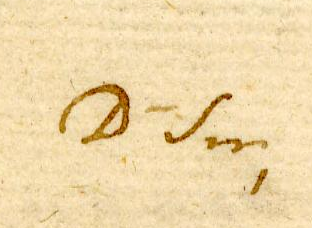D Sir
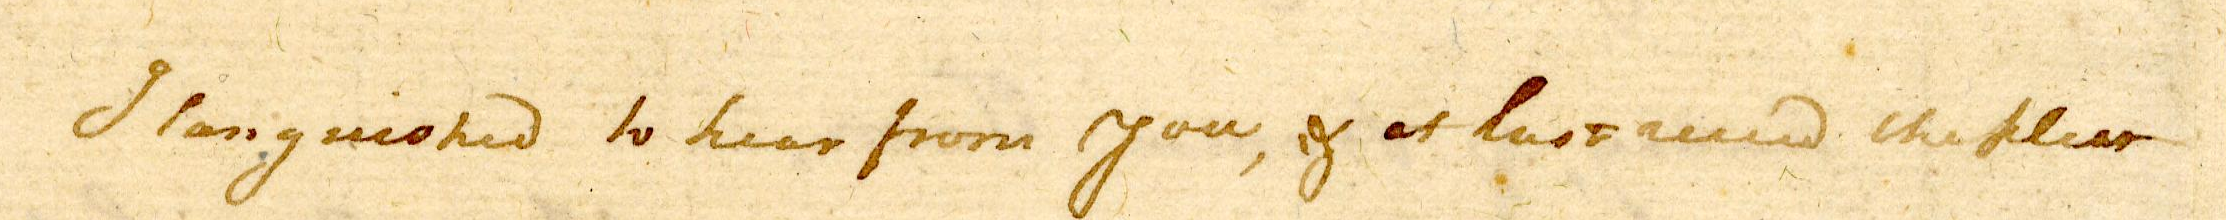I languished to hear from you, & at last received the pleas-
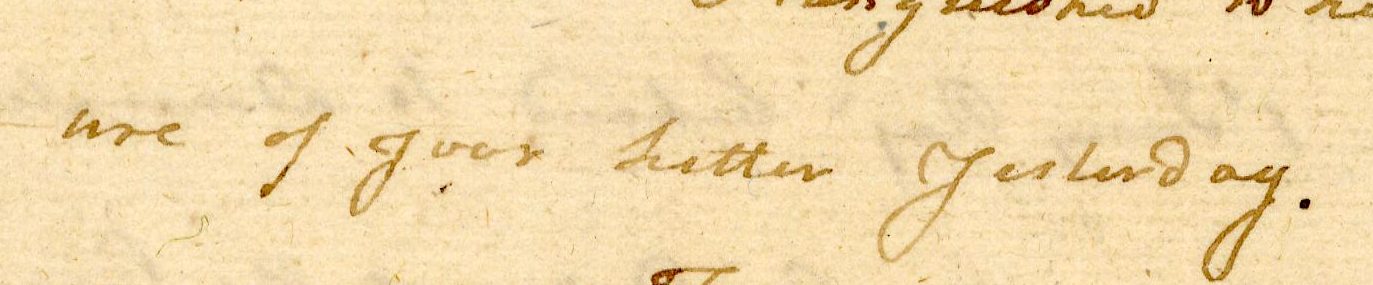-ure of your letter Yesterday.
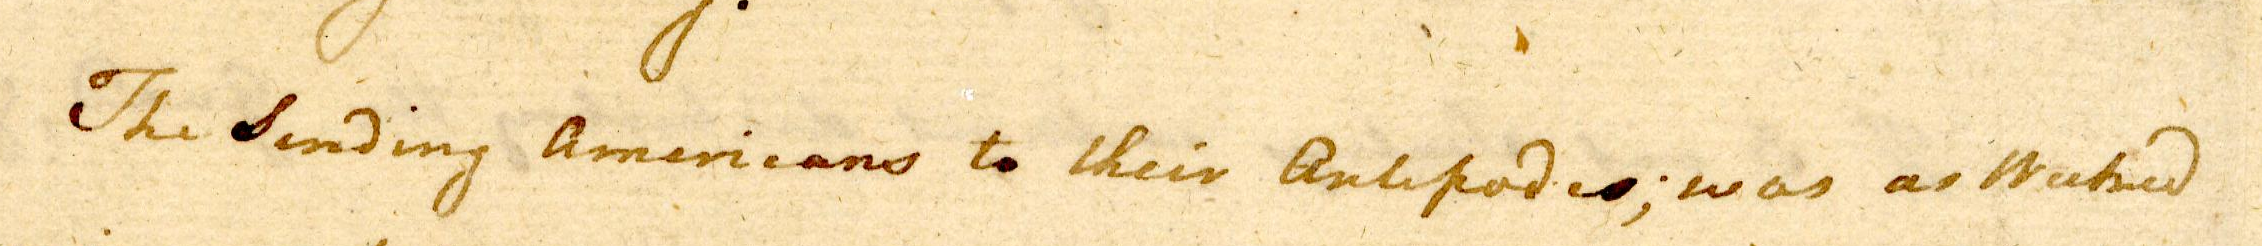The Sending Americans to their Antepodes; was as wicked
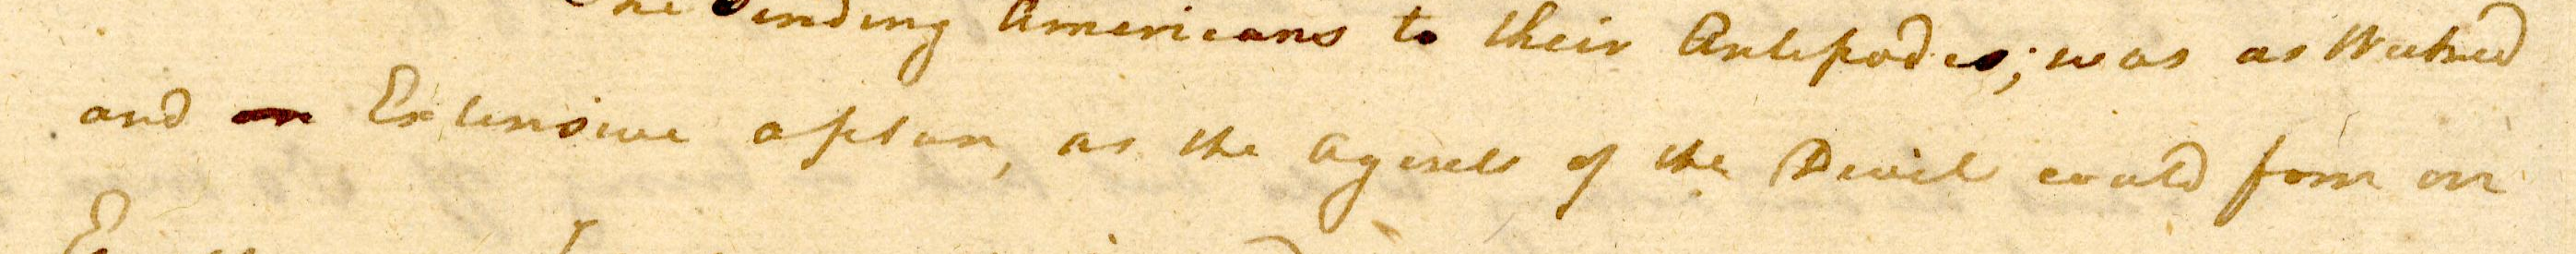and [__] Extensive option, as the agents of the Devil would form on
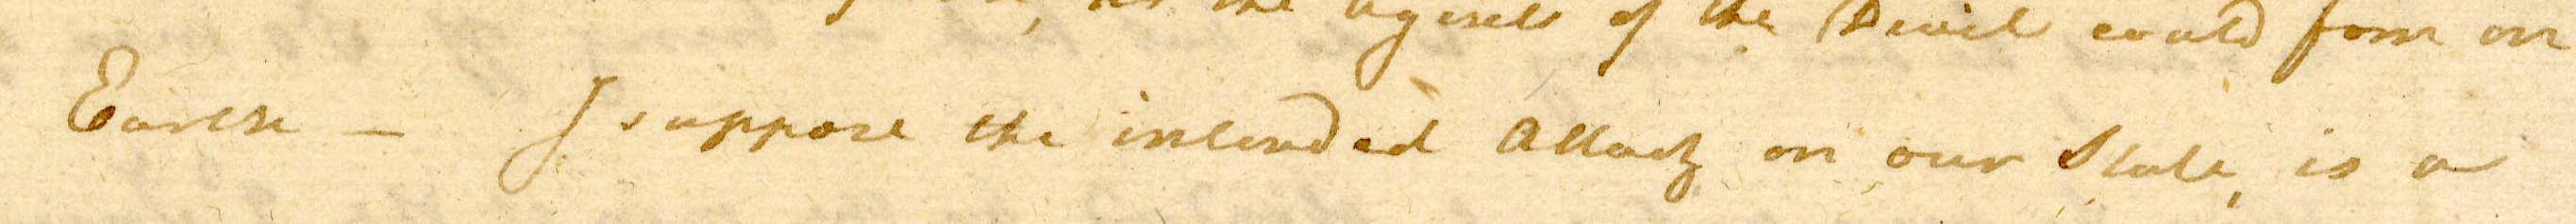Earth-. I suppose the intended Allows on our state is a
